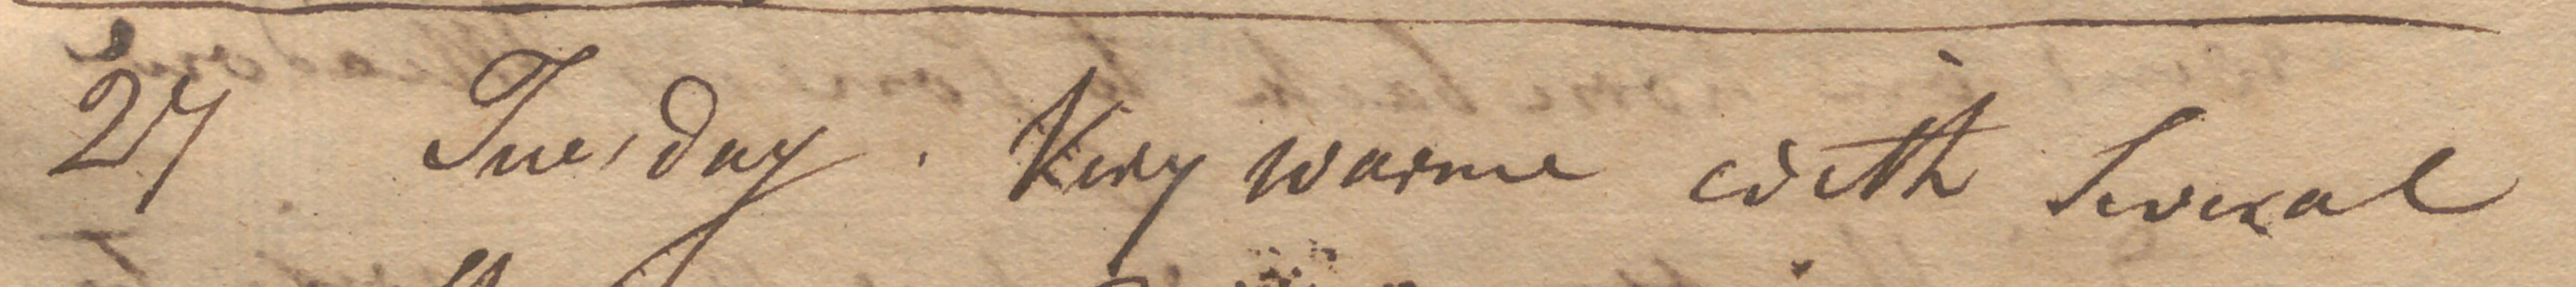27 Tuesday. Very warme with several
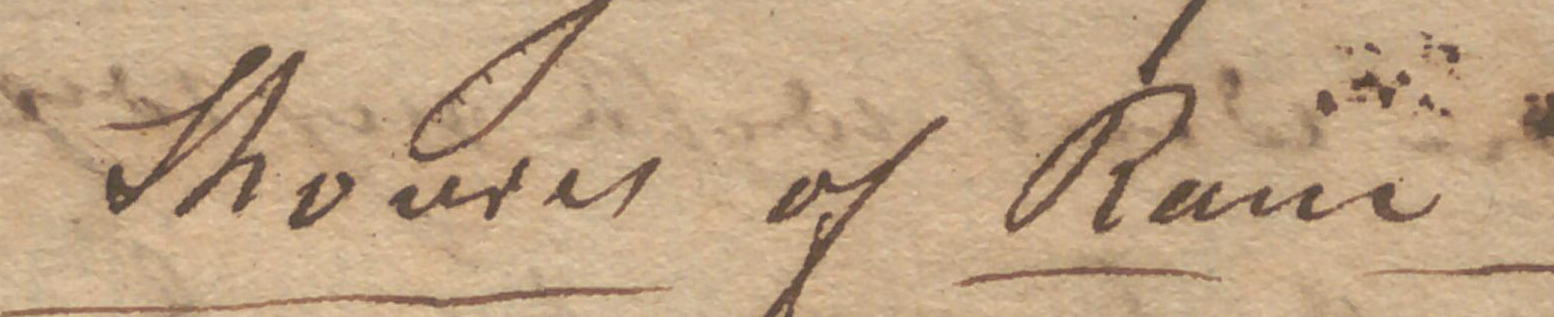Shoures of Rain
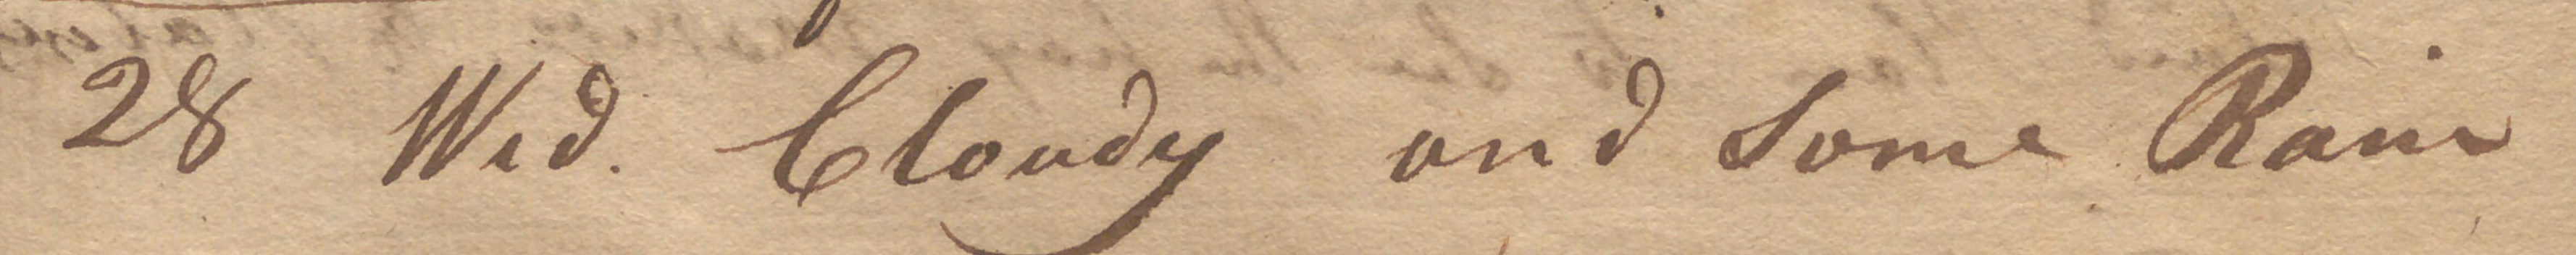28 Wed. Cloudy and some Rain
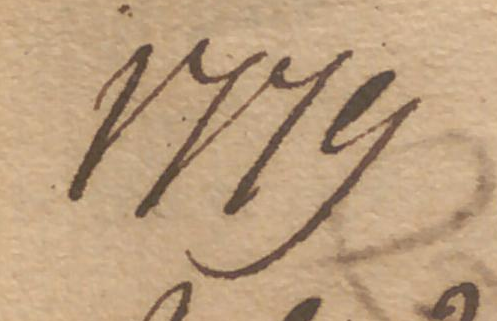1779
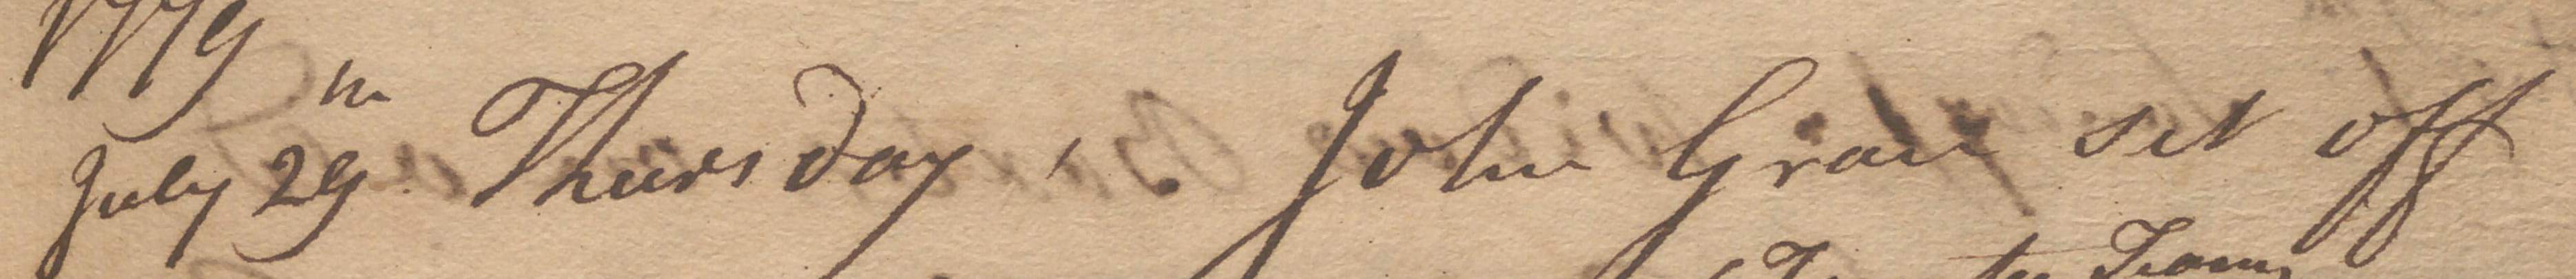July 29^th. Thursday John Grau set off
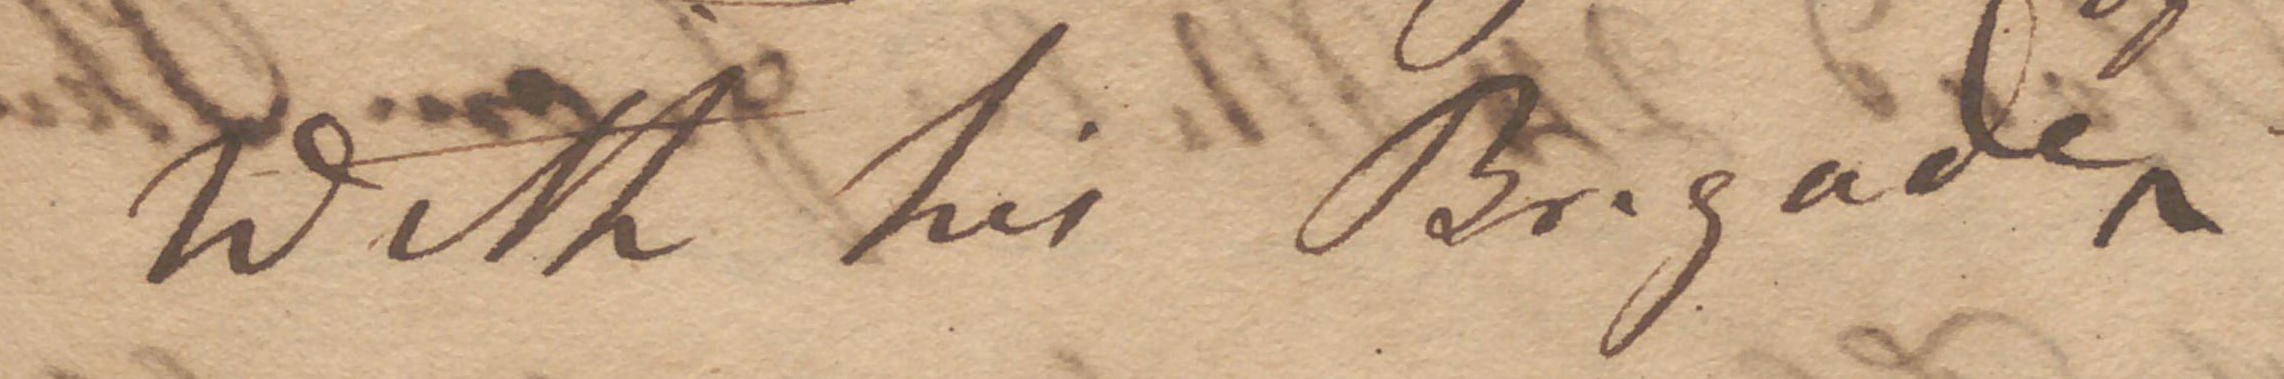with his Brigade ^
